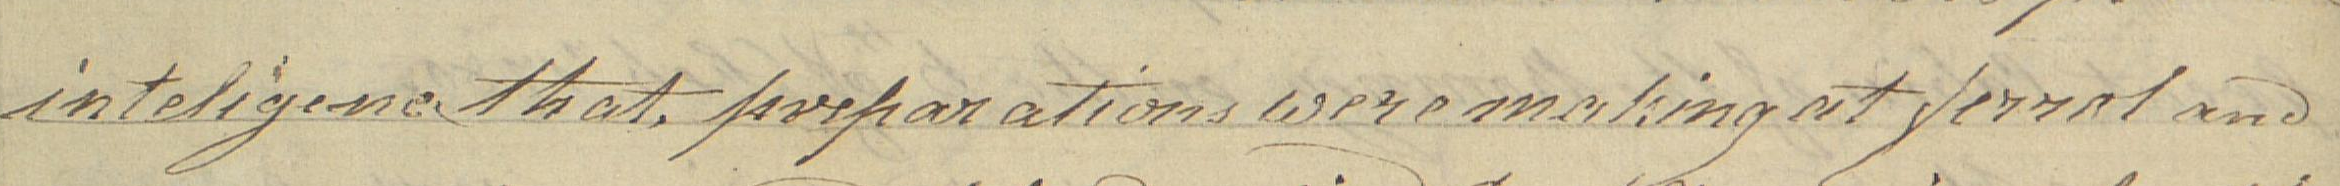inteligence that preparations were making at ferrat and
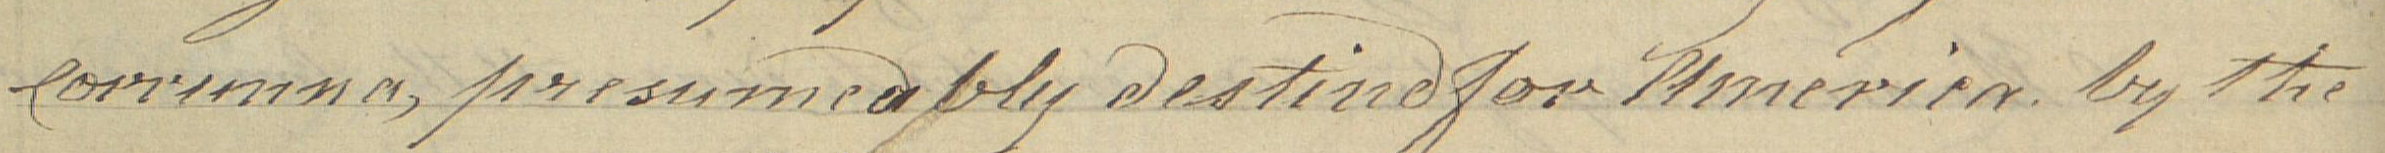corrinna presumeably destind for America by the
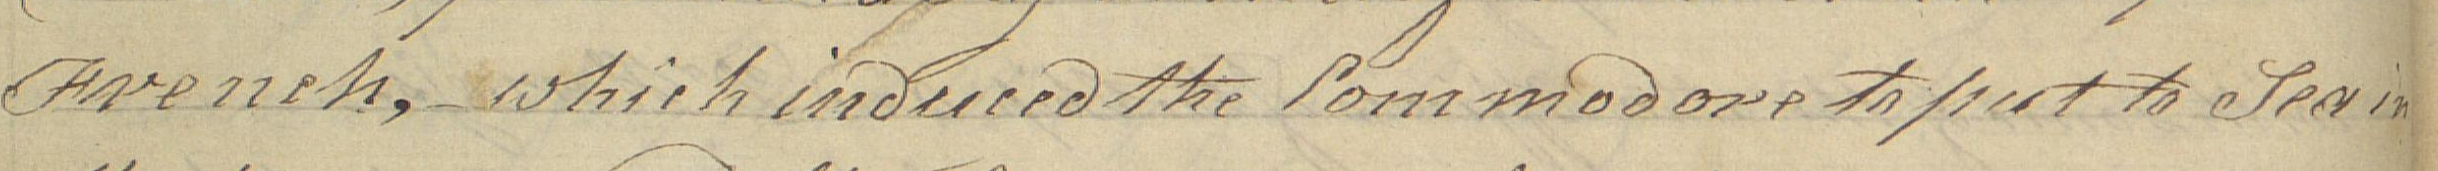French, which induced the Commodore to put to Sea in
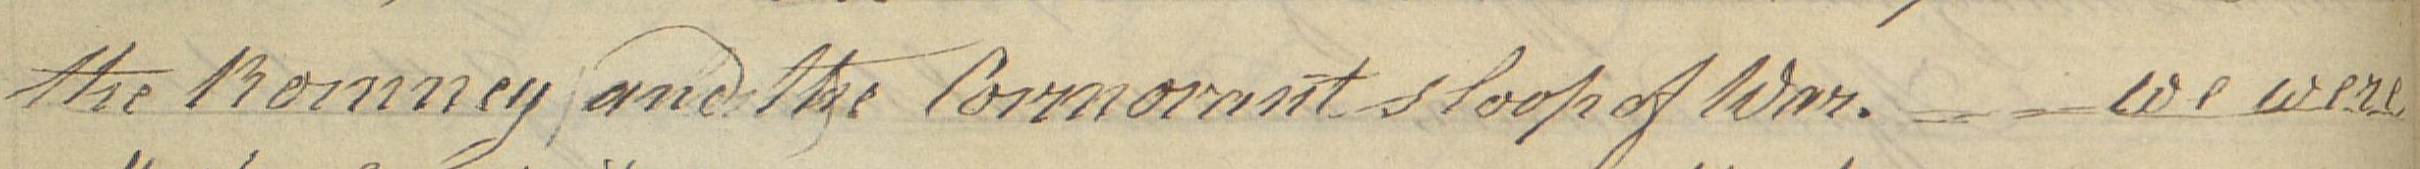the Romney and the Cormorant sloop of War.- we were
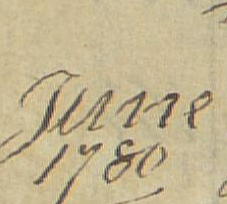June
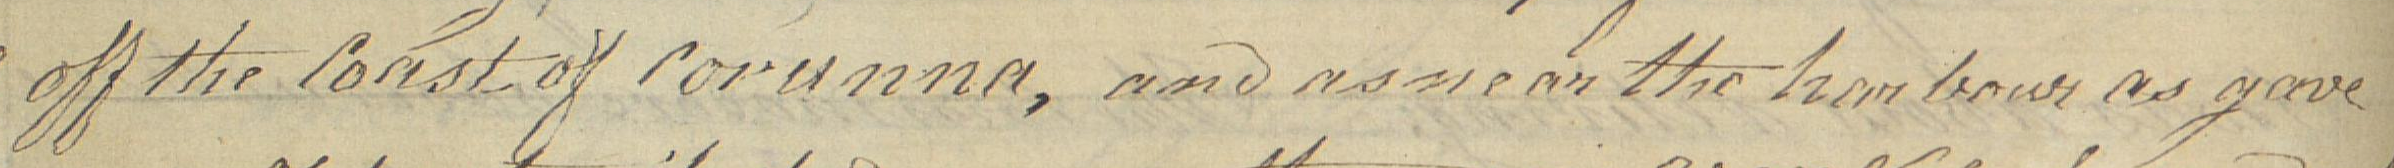off the Coast of corunna, and as near the harbour as gave
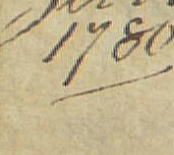1780
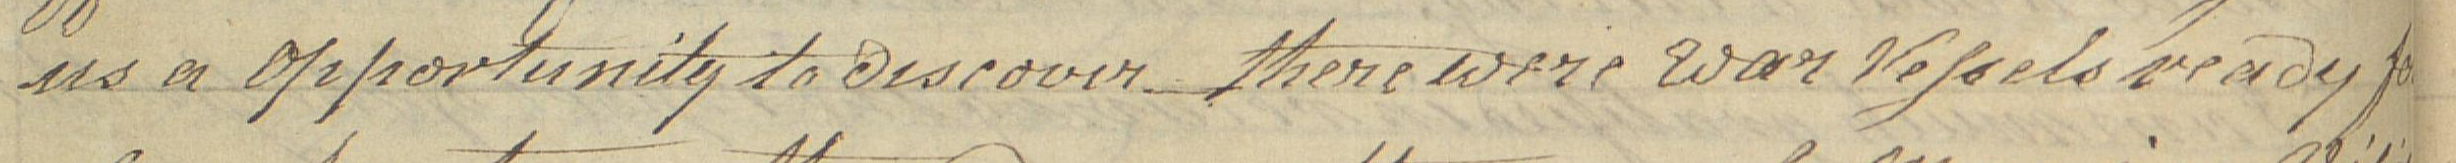us a opportunity to discover there were war Vessels ready for
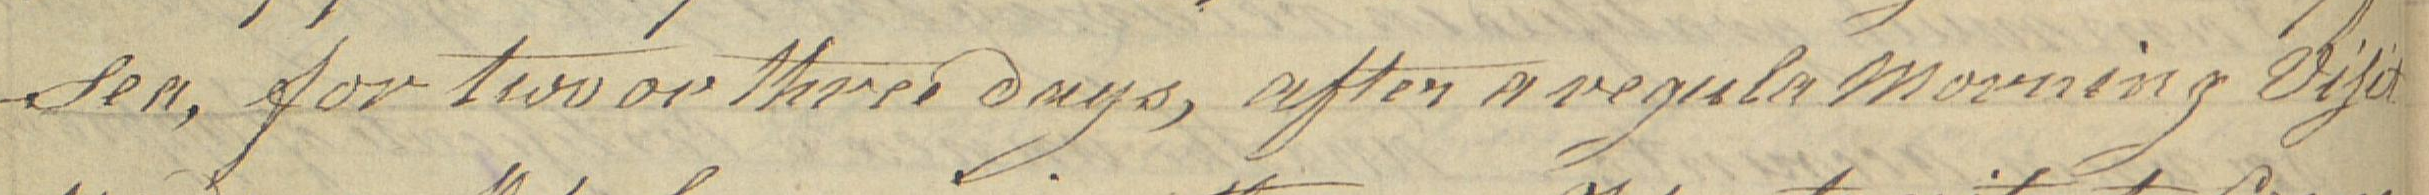sea, for two or three days, after a regula morning Visit
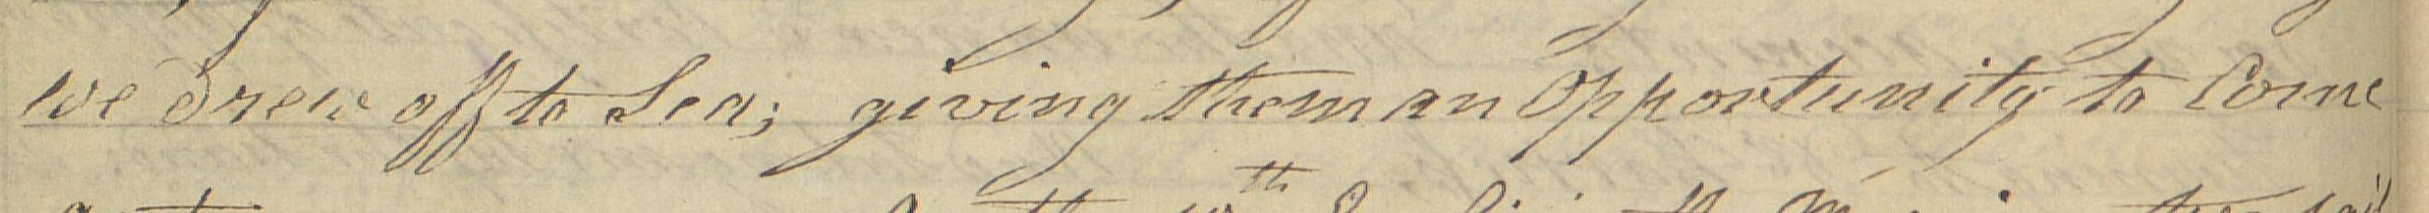we drew off to Sea; giving them an opportunity to come
